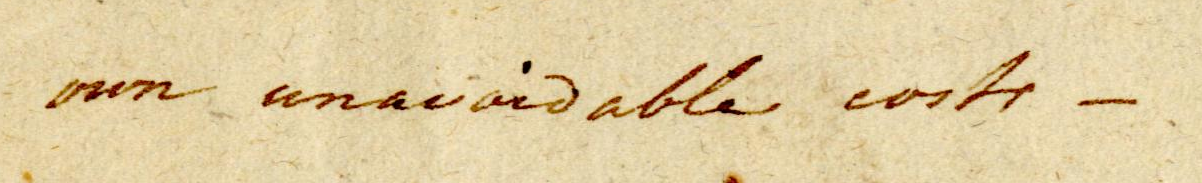own unavaidable costs-
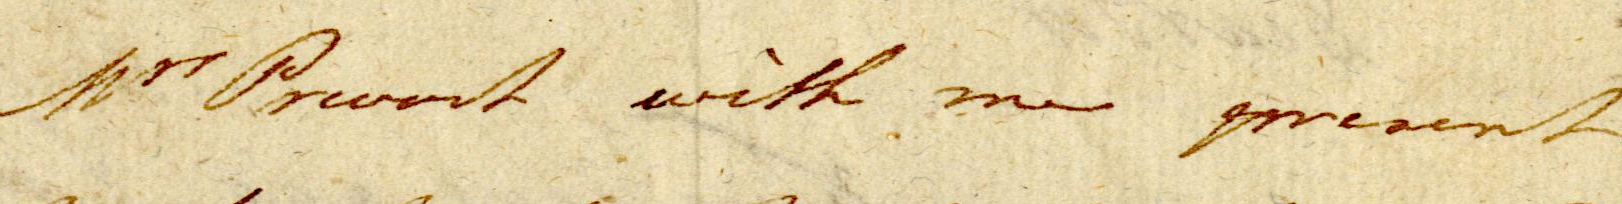M^r. Pruvart with me present
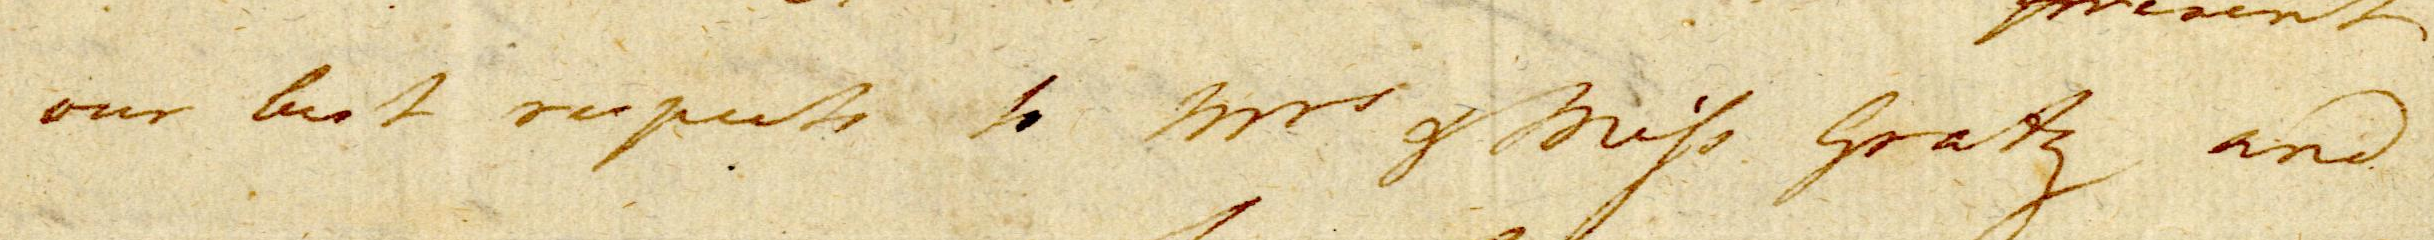our best respects to M^rs. & Miss Gratz and
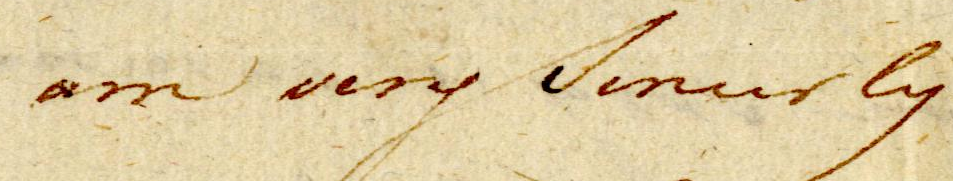am very Sincerly
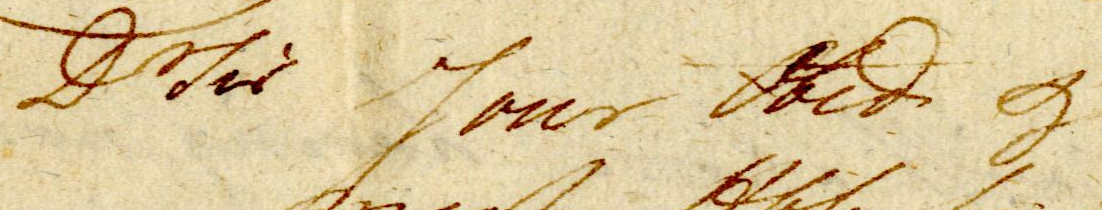D^r Sir Your Obed &
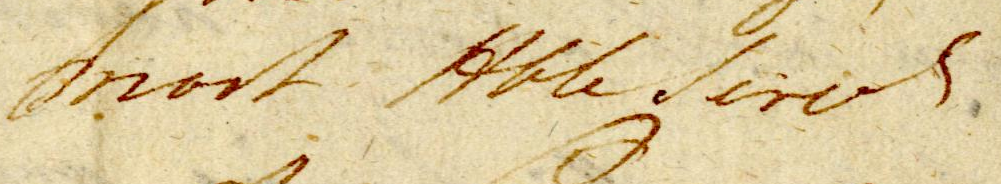most Hble serv^t
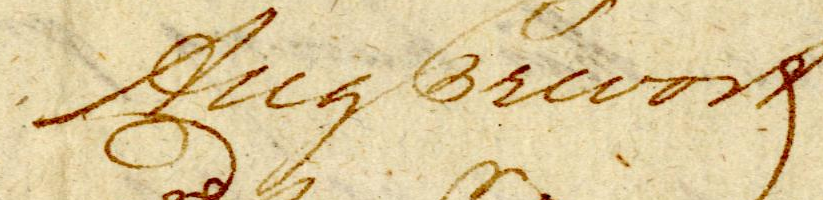Aug Prevost
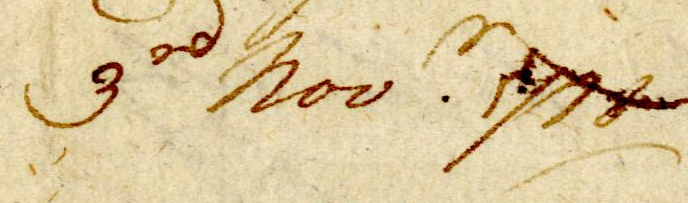3^rd Nov. 1788
